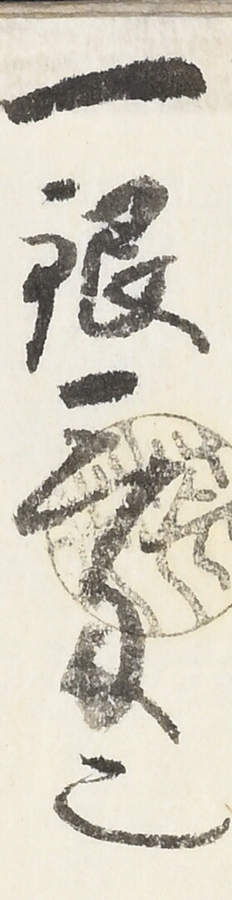一銀六匁也
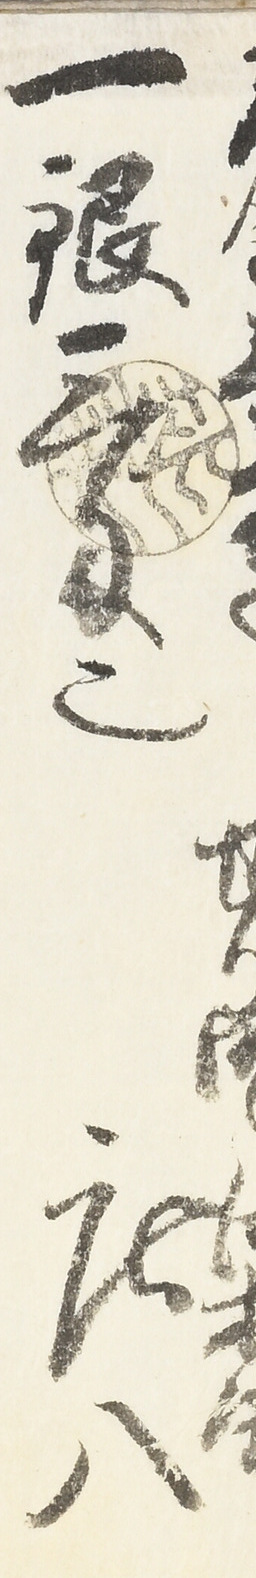一銀三匁也庄八
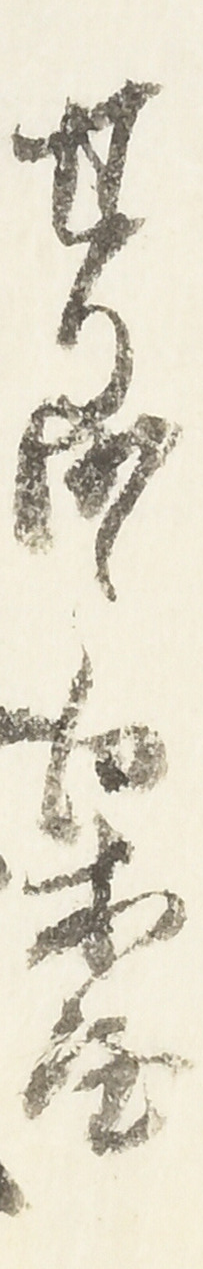せり町白木屋
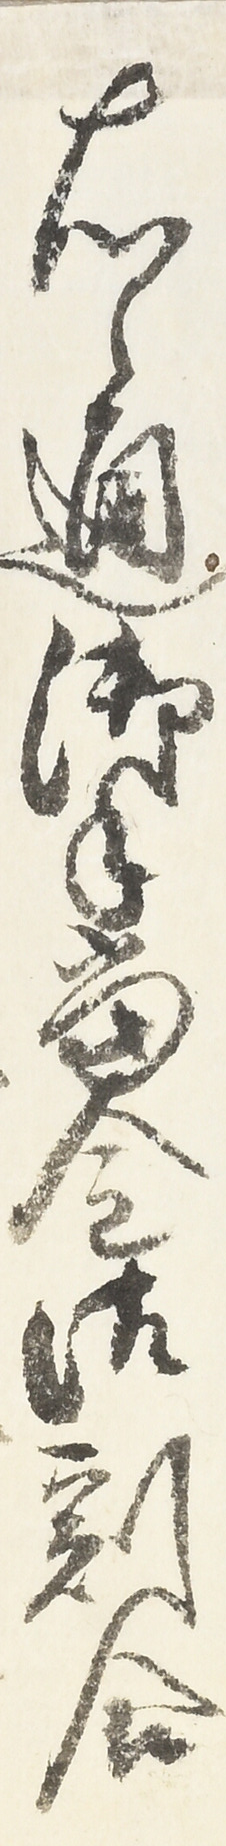右之通御手当金御割合
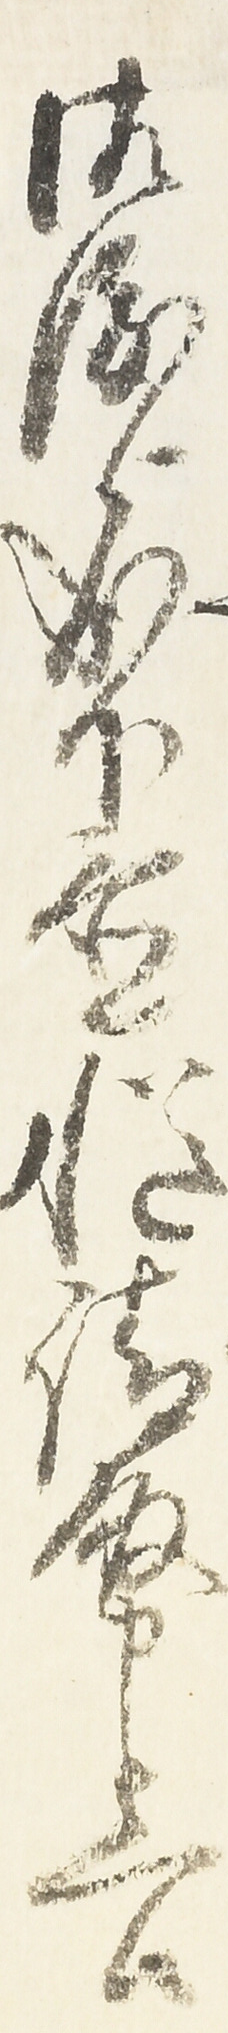御渡被成下置慥請取申上候
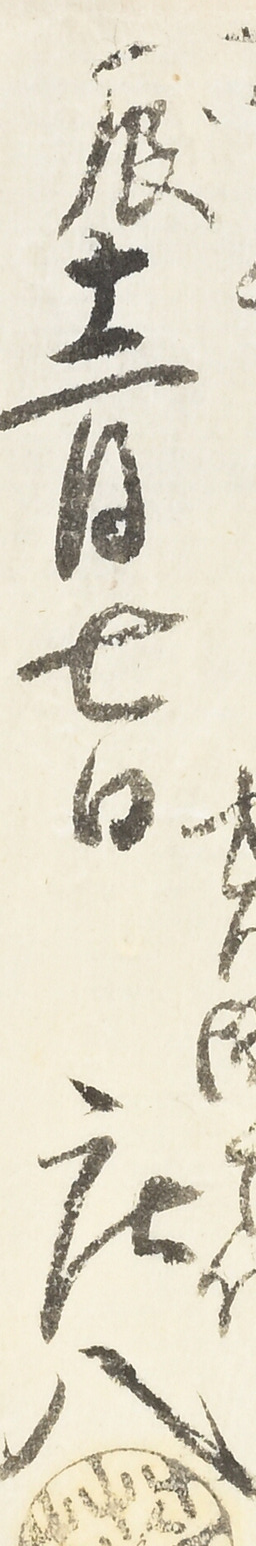辰十二月七日庄八
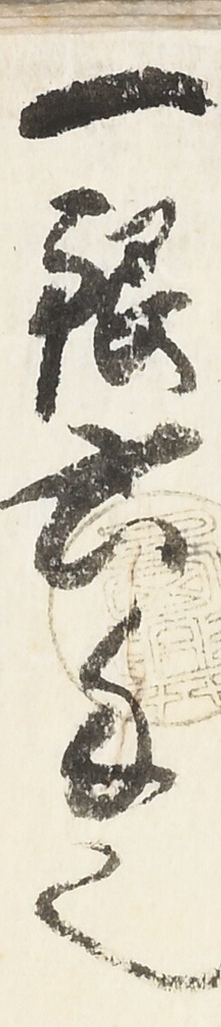一銀六匁也
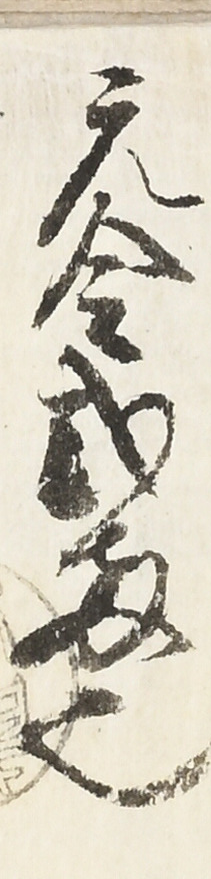元金壱両也
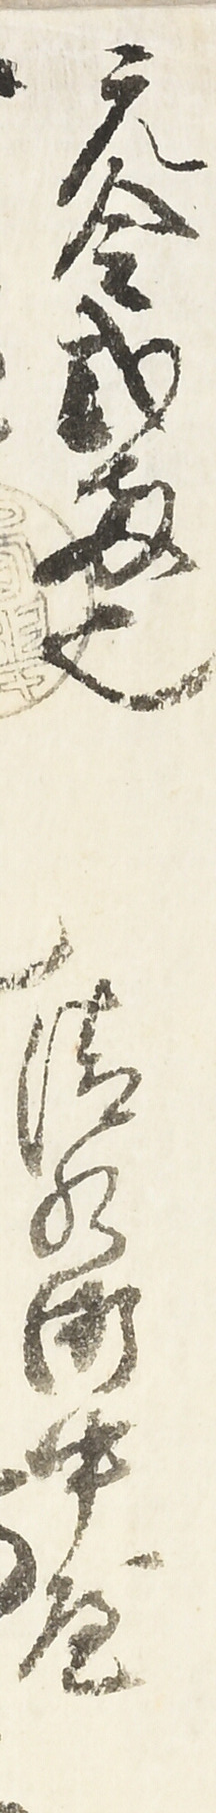元金弐両也清水町中屋
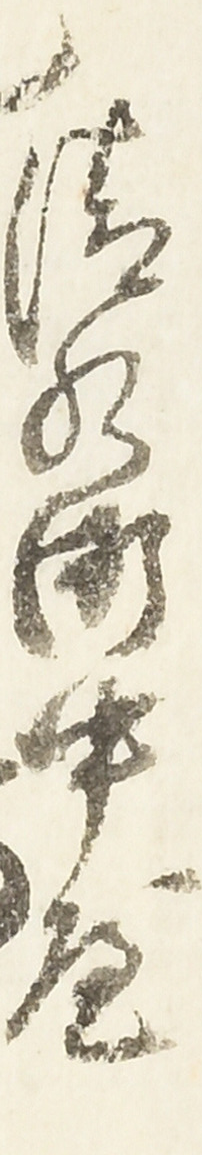清水町丁代
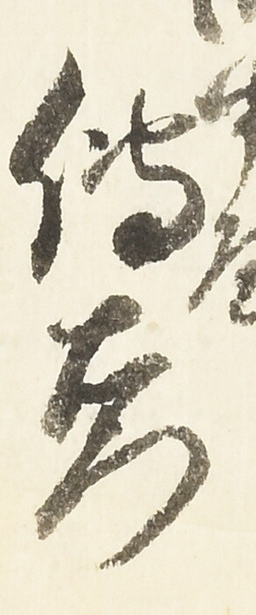伝右衛門
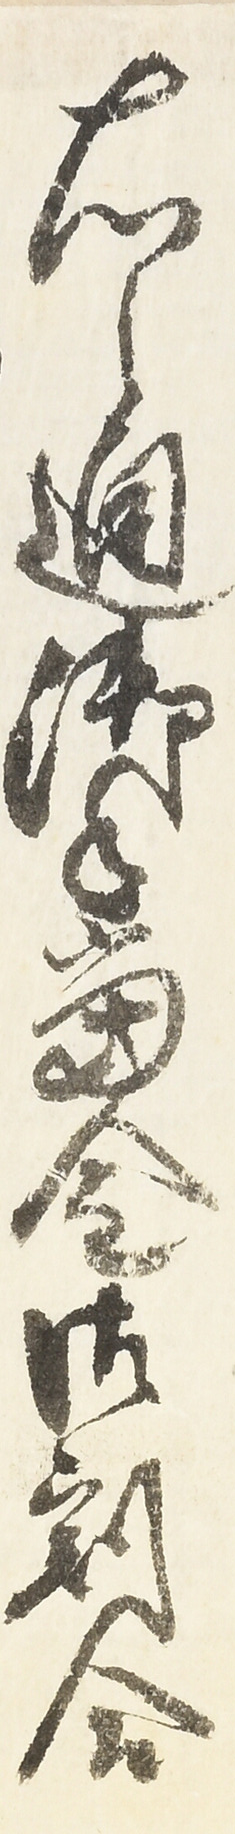右之通御手当金御割合
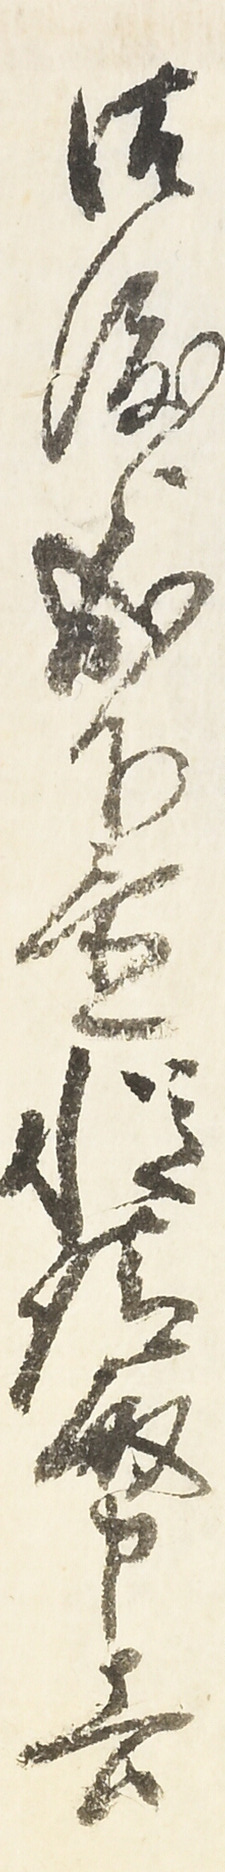御渡被成下置慥請取申上候
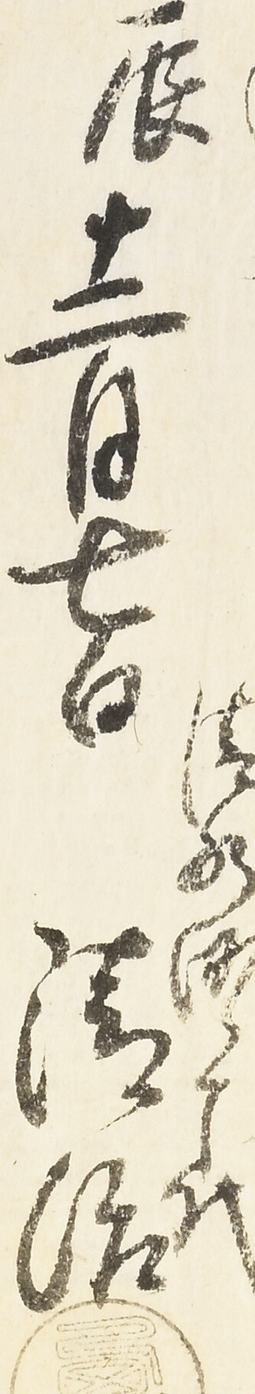辰十二月七日清治
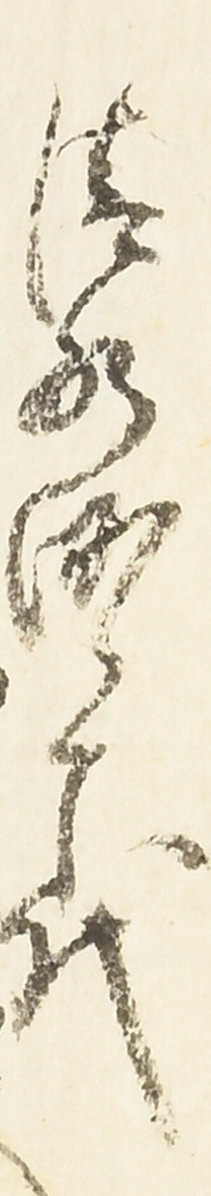清水町丁代

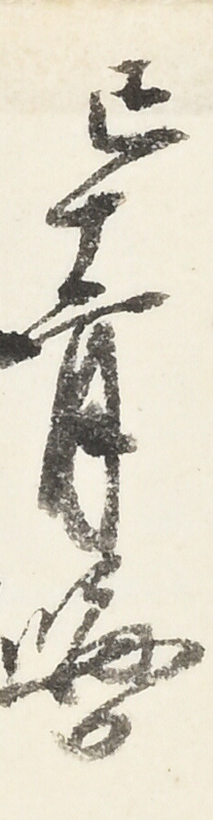巳十二月晦日
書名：御才覚金御利足割渡扣帳
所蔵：伊那市立高遠町図書館・合同会社AMANE
